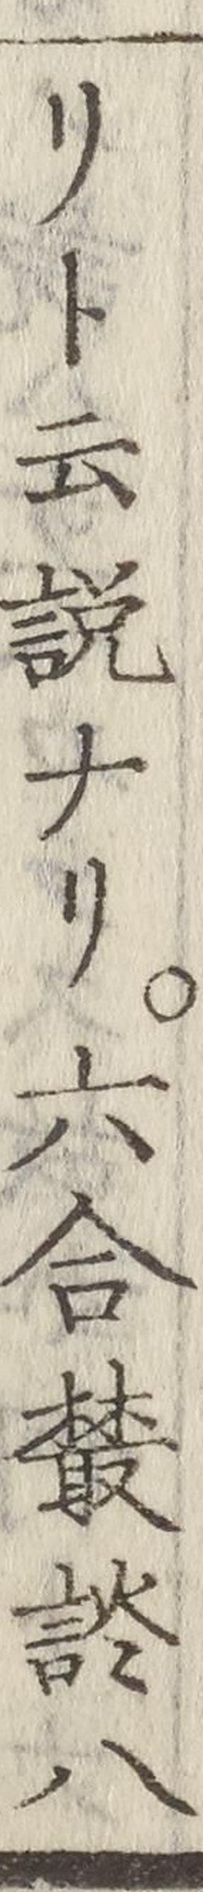リト云説ナリ。六合樷談ハ
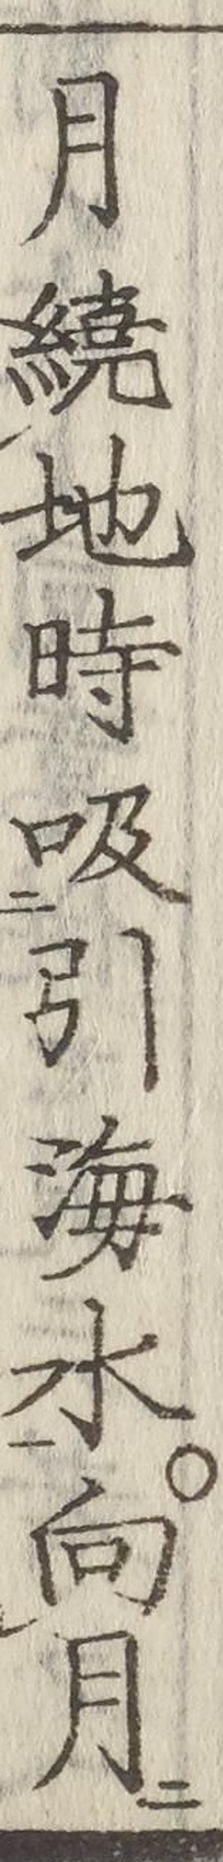月繞地時吸引海水。向月
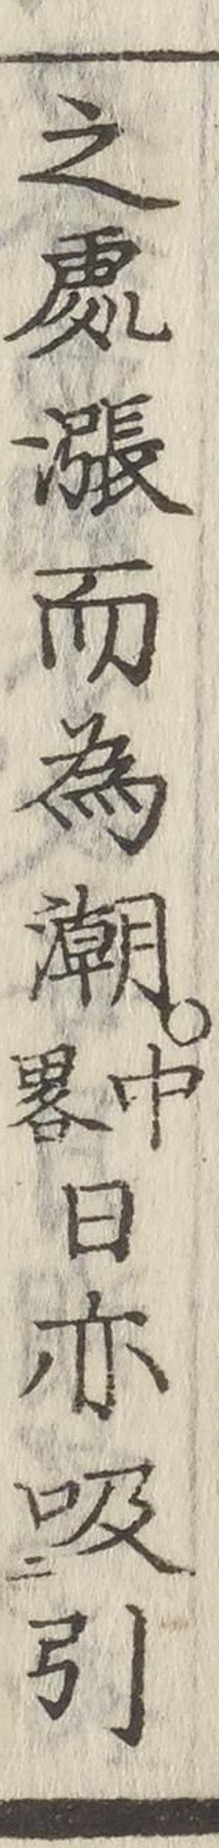之処漲而為潮。中略日亦吸引
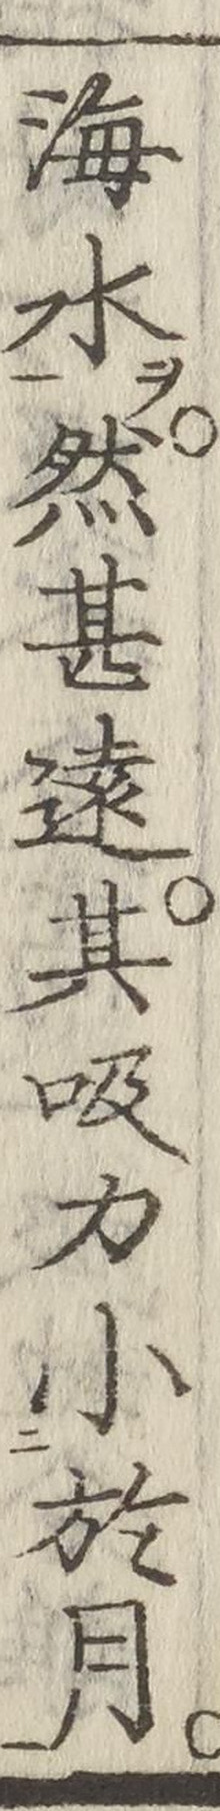海水。然甚遠。其吸カ小於月。

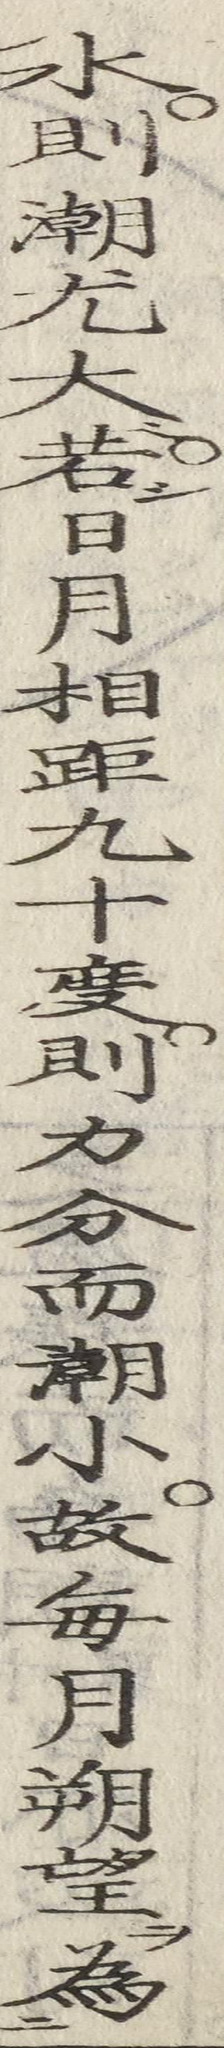水。則潮尤大二。若日月相距九十度。則カ合而潮小。故毎月朔望為
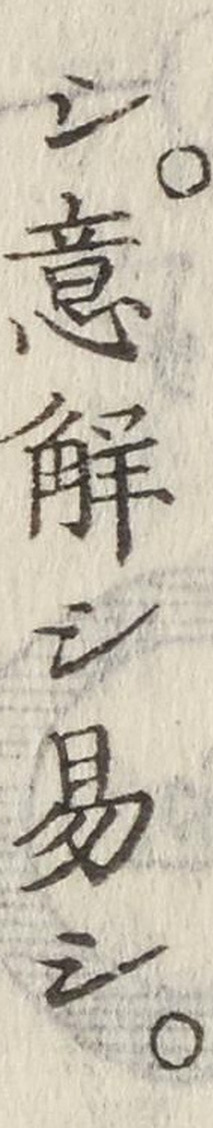シ。意解シ易シ。
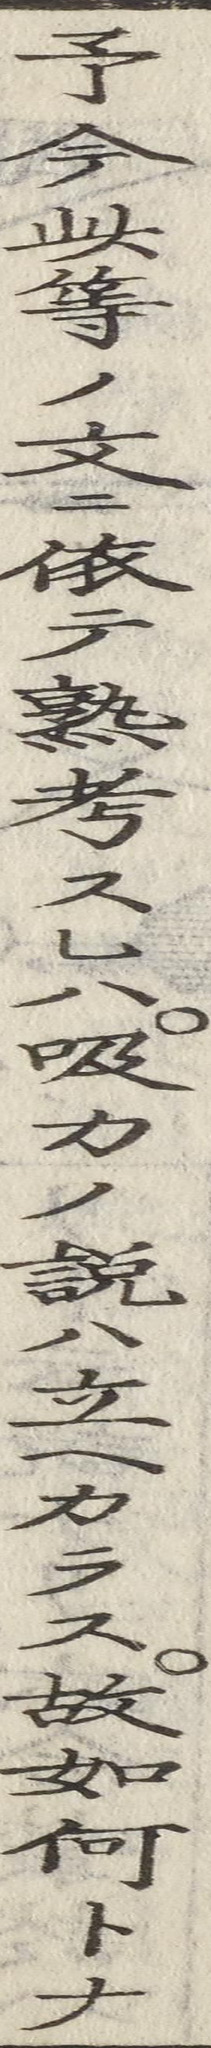予今此等ノ文ニ依テ熟考スレハ。吸カノ説ハ立ヘカラス。故如何トナ
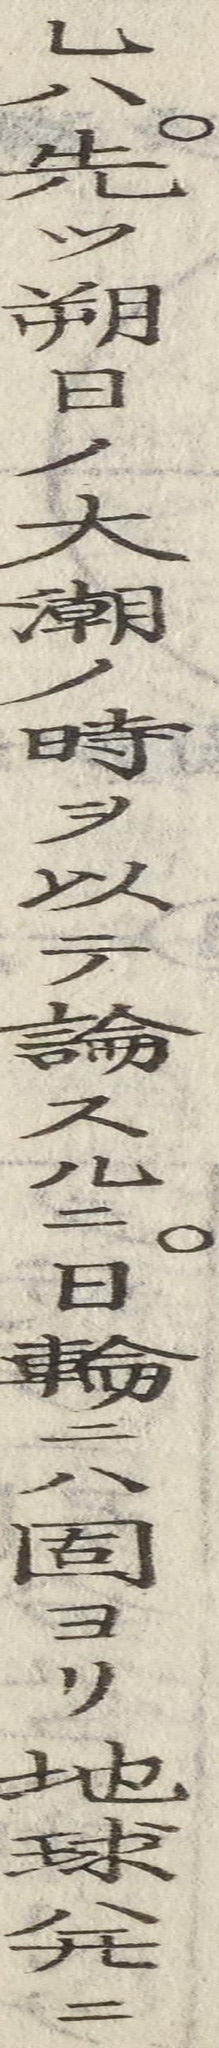レハ。先ツ朔日ノ大潮ノ時ヲ以テ論スルニ。日輪ニハ固ヨリ地球并ニ
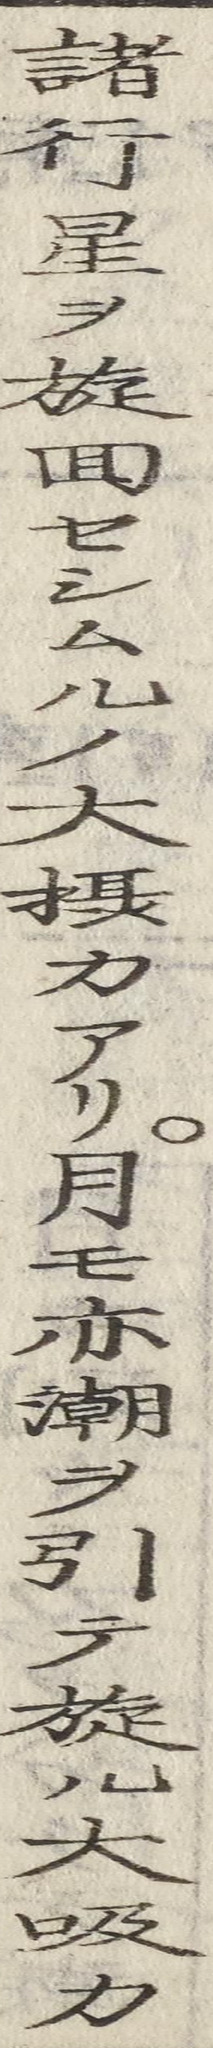諸行星ヲ旋回セシムルノ大摂カアリ。月モ亦潮ヲ引テ旋ル大吸カ
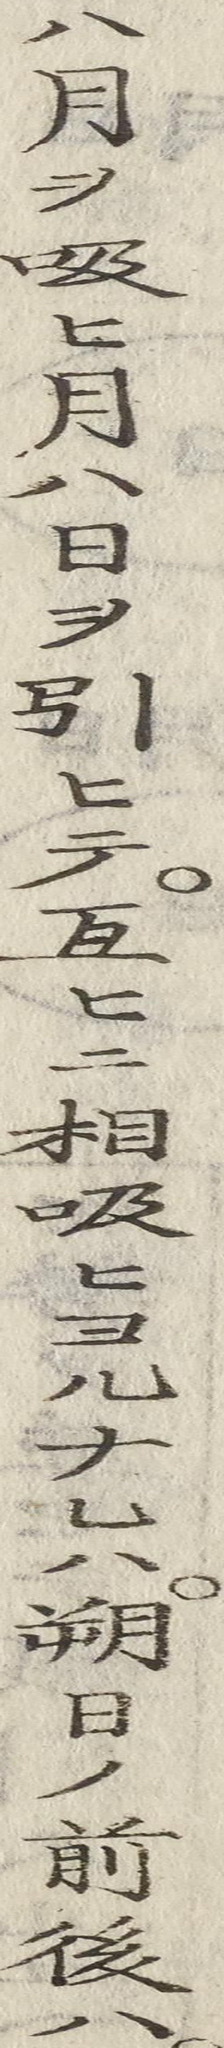ハ月ヲ吸ヒ月ハ日ヲ引ヒテ。互ヒニ相吸ヒヨルナレハ。朔日ノ前後ハ。
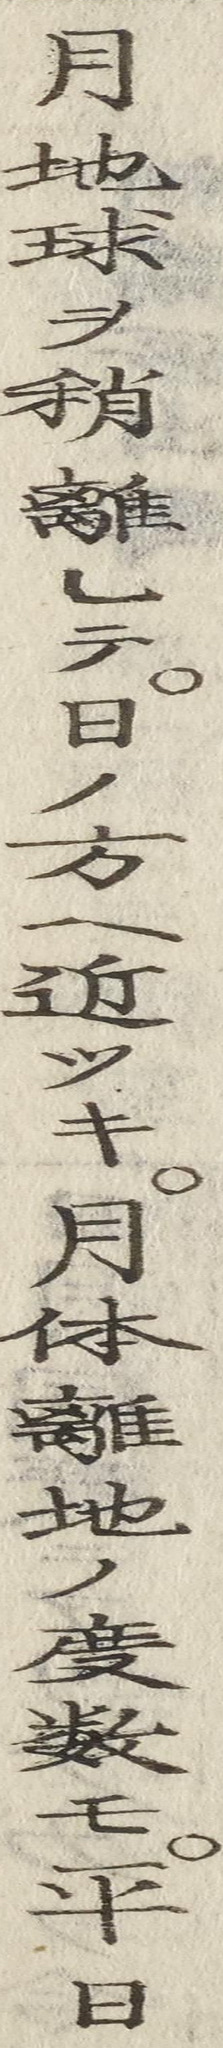月地球ヲ稍離レテ。日ノ方ヘ近ツキ。月体離地ノ度数モ。平日
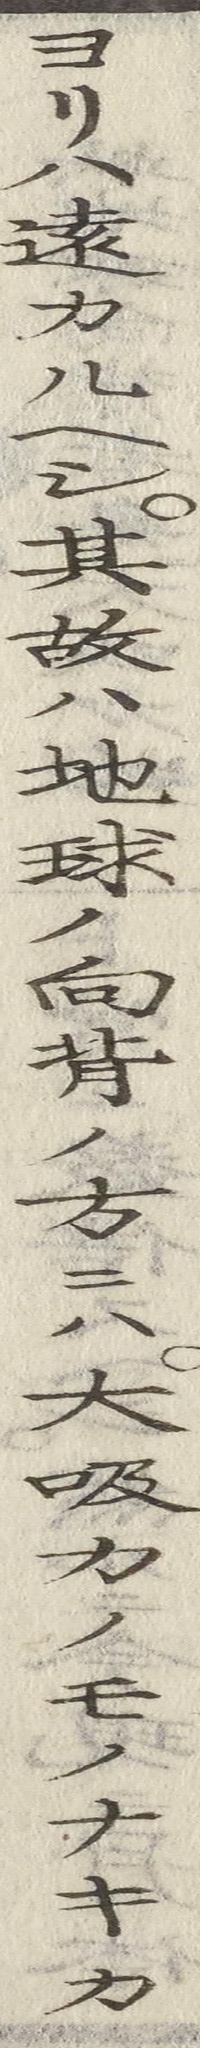ヨリハ遠カルヘシ。其故ハ地球ノ向背ノ方ニハ。大吸カノモノナキカ
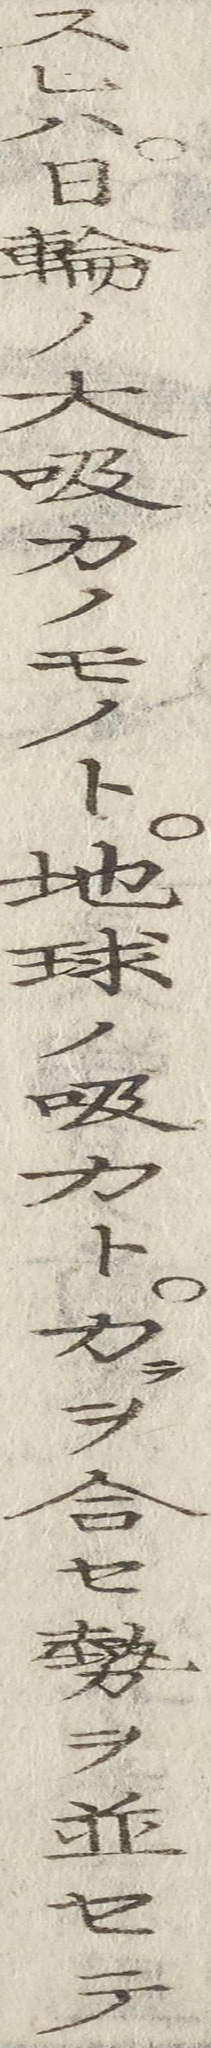スレハ。日輪ノ大吸カノモノト。地球ノ吸カト。力合セ勢ヲ並セテ
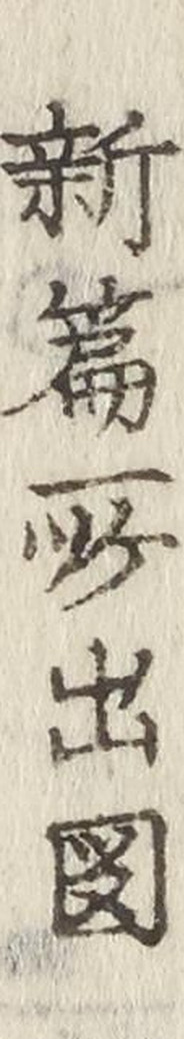新篇所出図
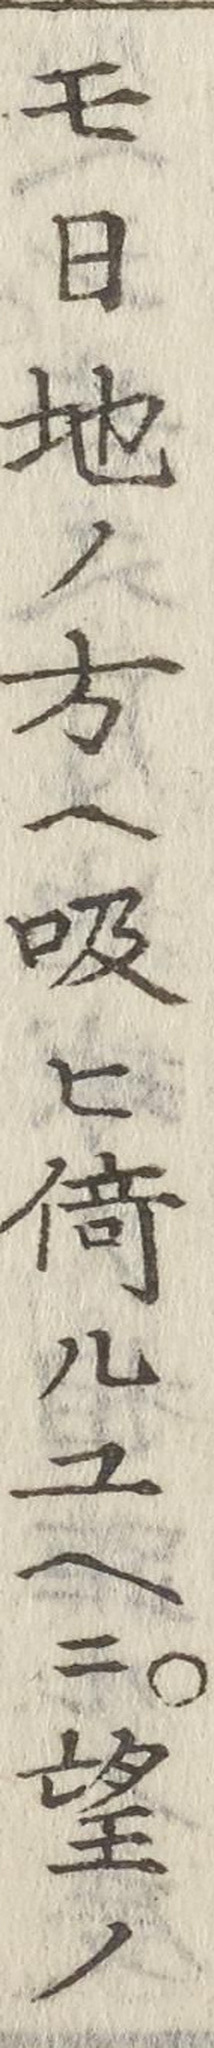モ日地ノ方ヘ吸ヒ倚ルユヘニ。望ノ
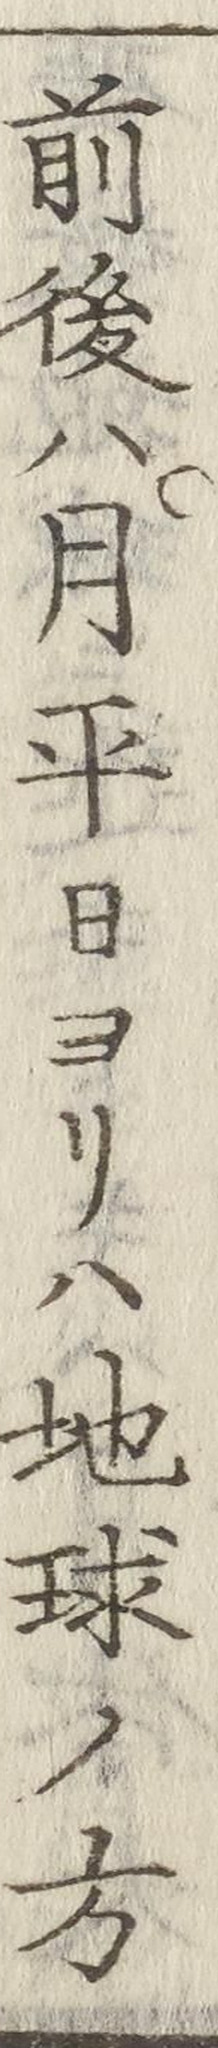前後ハ。月平日ヨリハ地球ノ方
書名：護法新論　中
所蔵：東京大学地震研究所図書室 Earthquake Research Institute Library, The University of Tokyo, JAPAN
